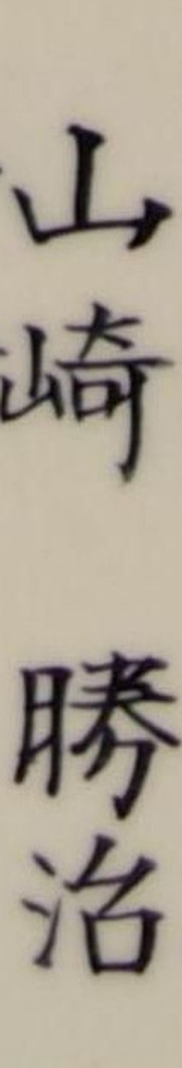山崎勝治
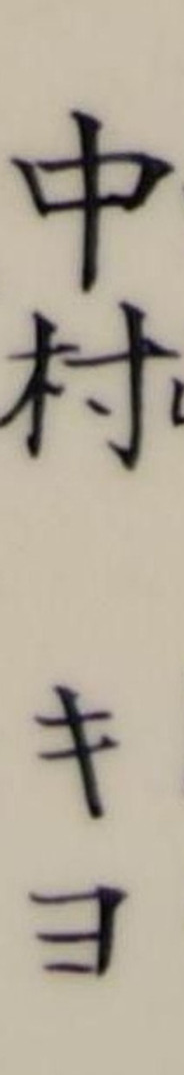中村キヨ
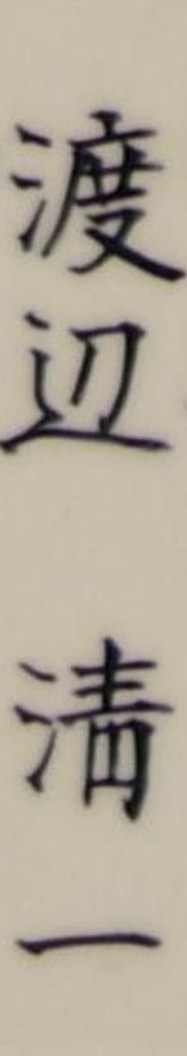渡辺清一
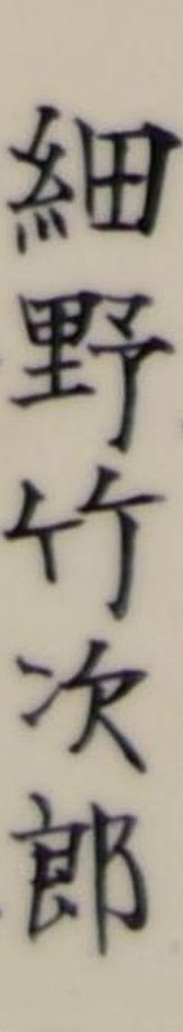細野竹次郎
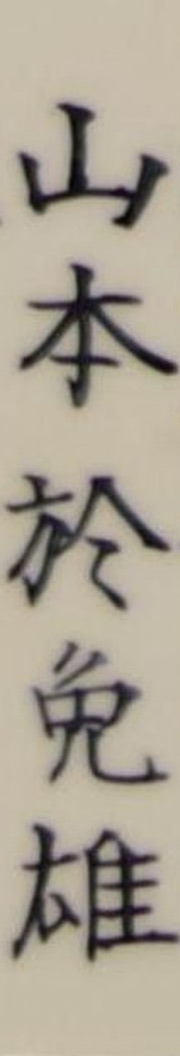山本於免雄
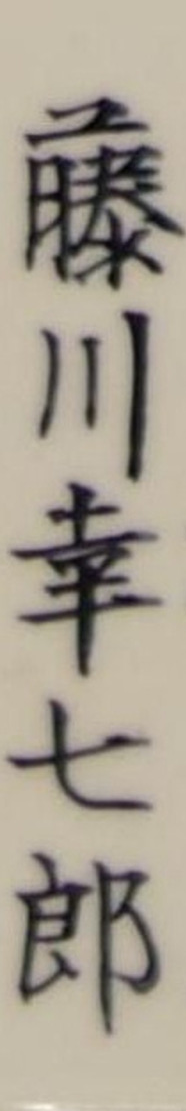藤川幸七郎
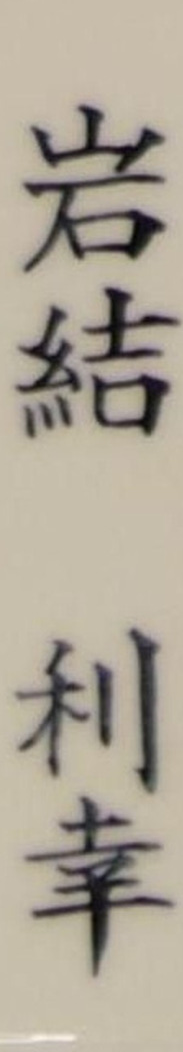岩結利幸
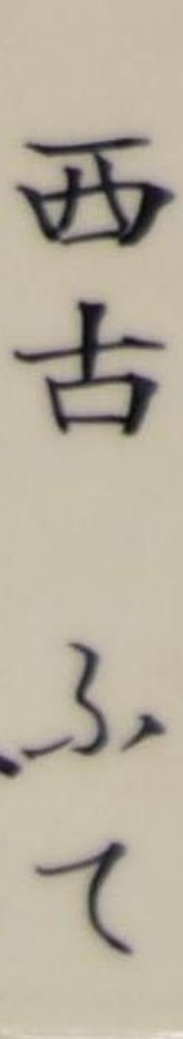西古ふて
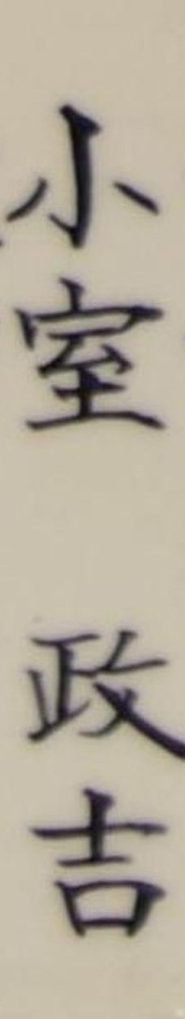小室政吉
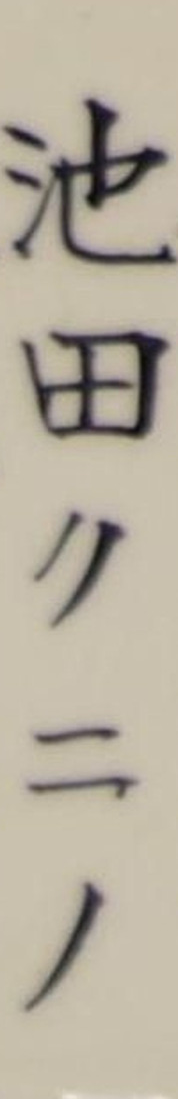池田クニノ
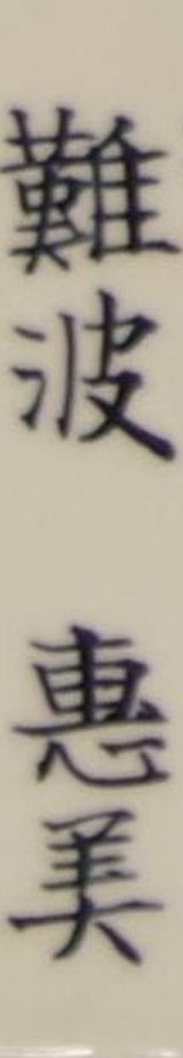難波恵美
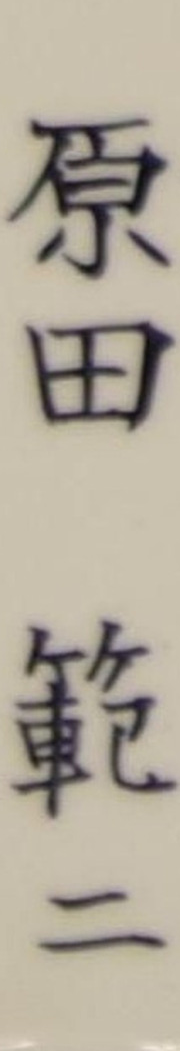原田範二
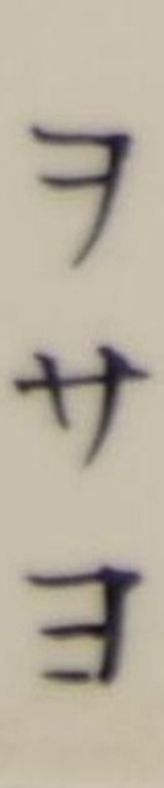ヲサヨ
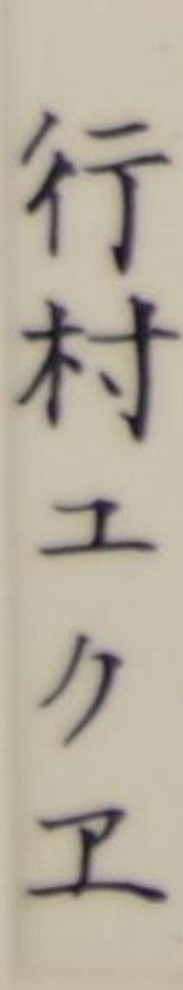行村ユクエ

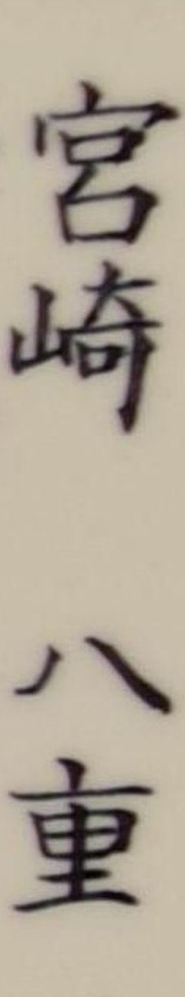宮崎八重
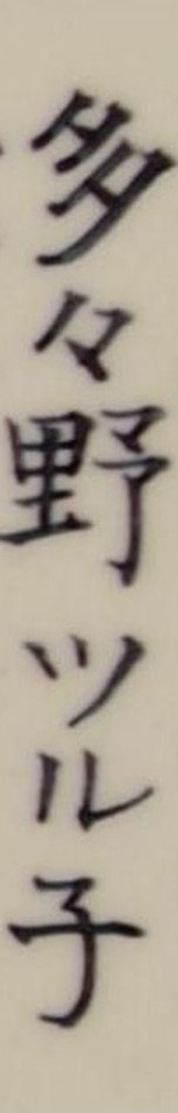多々野ツル子
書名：M~S
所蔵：高野山金剛峯寺
